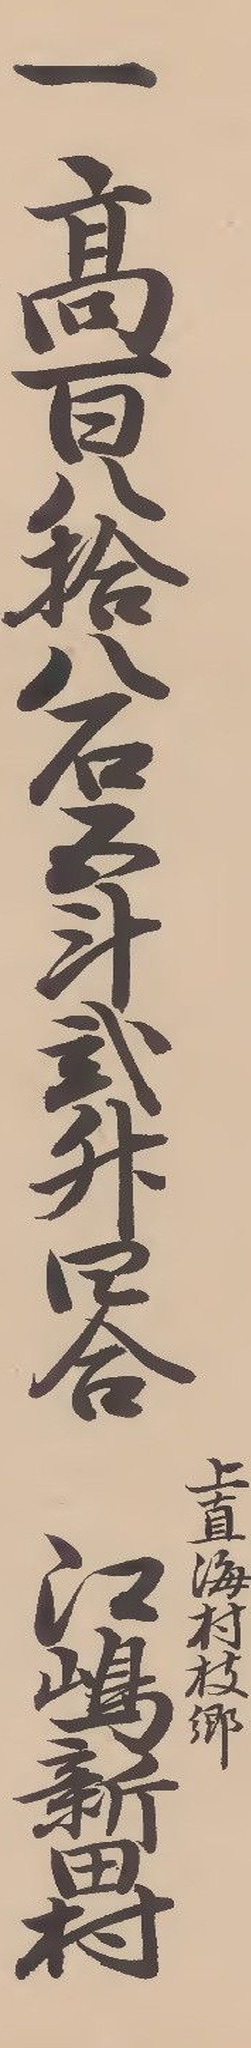一高百八拾八石五斗弐升四合江島新田村
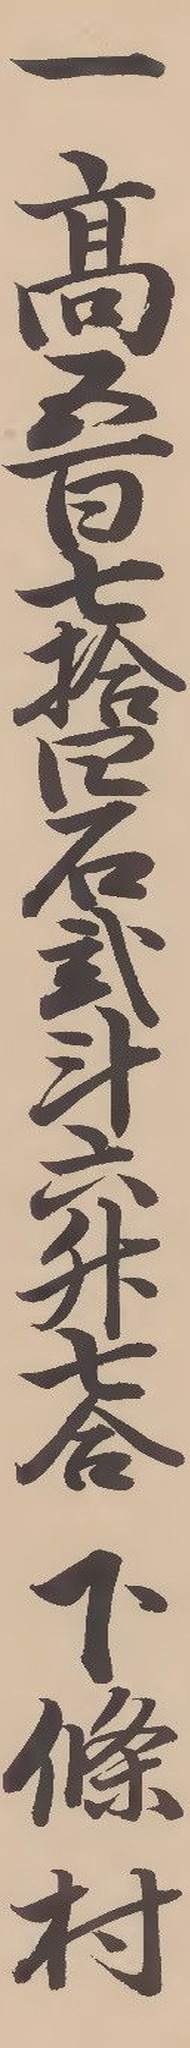一高五百七拾四石弐斗六升七合下条村
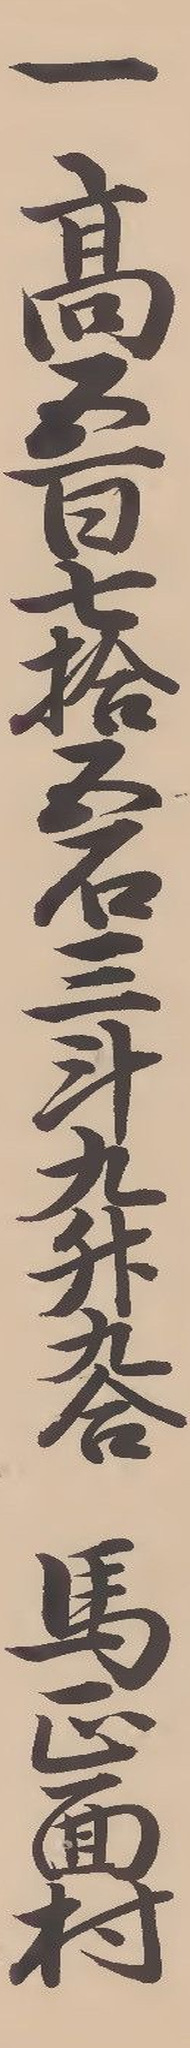一高五百七拾五石三斗九升九合馬正面村
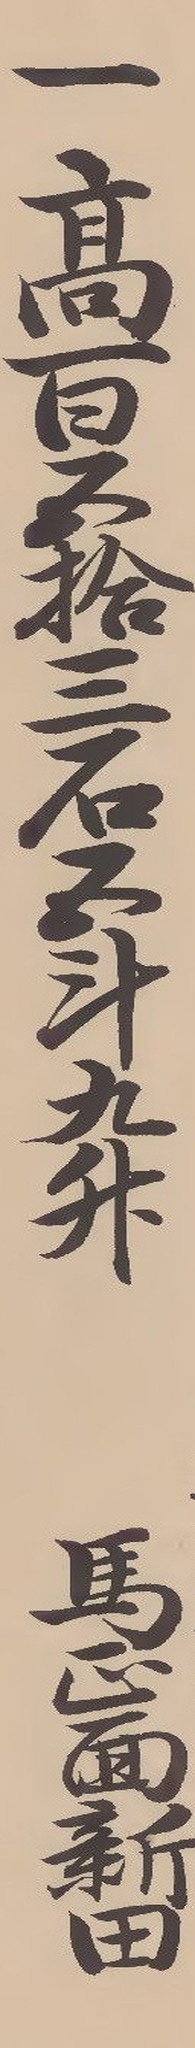一高百五拾三石五斗九升馬正面新田
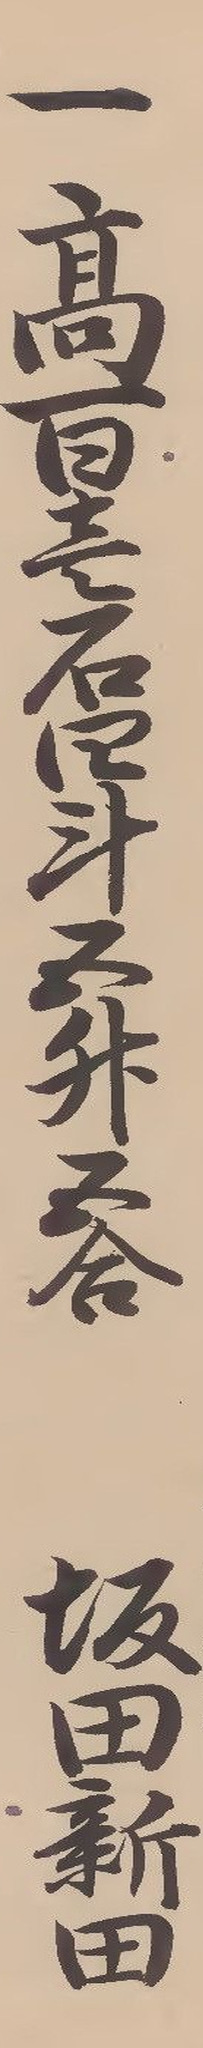一高百壱石四斗五升五合坂田新田
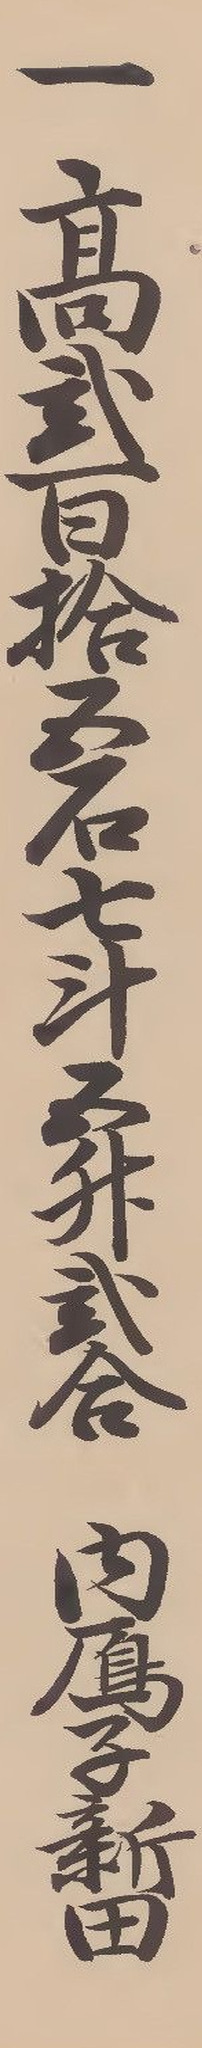一高弐百拾五石七斗五升弐合内雁子新田
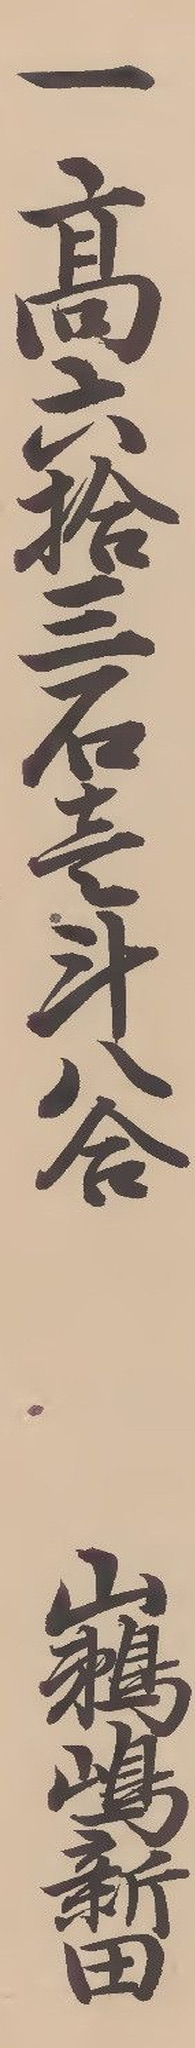一高六拾三石壱斗八合山鵜島新田

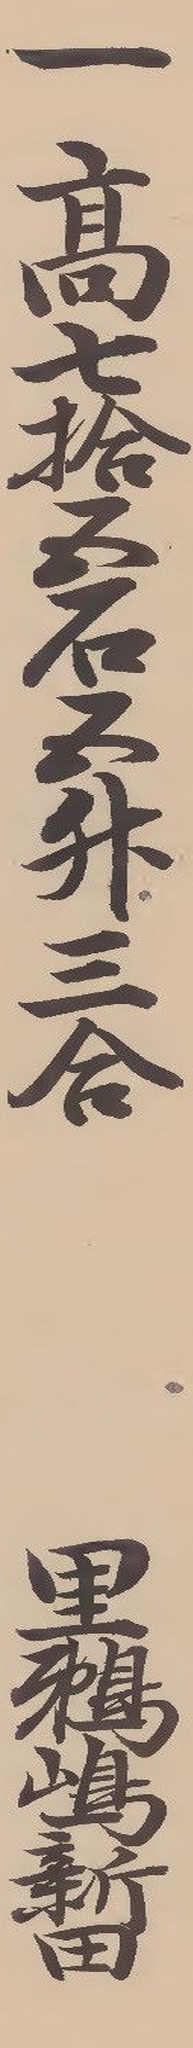一高七拾五石五升三合里鵜島新田
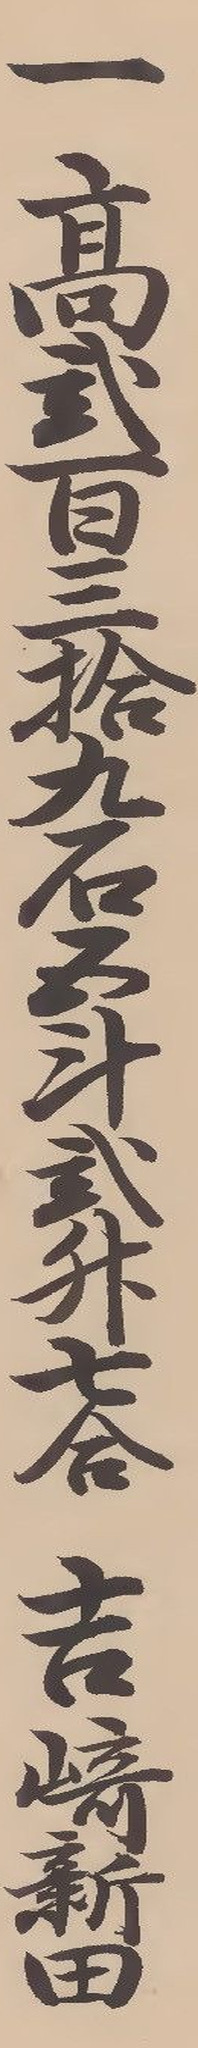一高弐百三拾九石五斗弐升七合吉崎新田
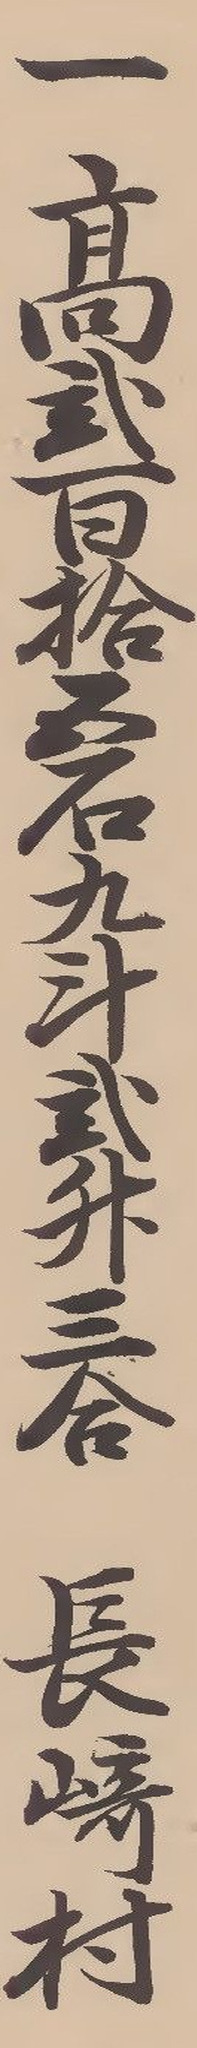一高弐百拾五石九斗弐升三合長崎村
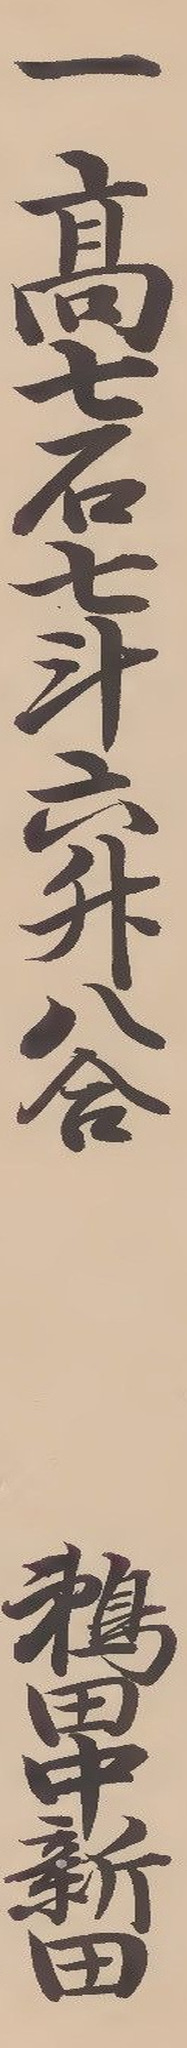一高七石七斗六升八合鵜田中新田
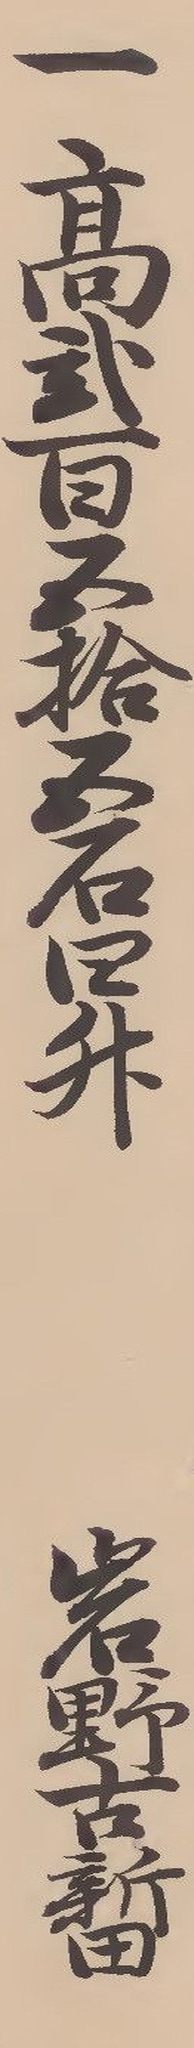一高弐百五拾五石四升岩野古新田
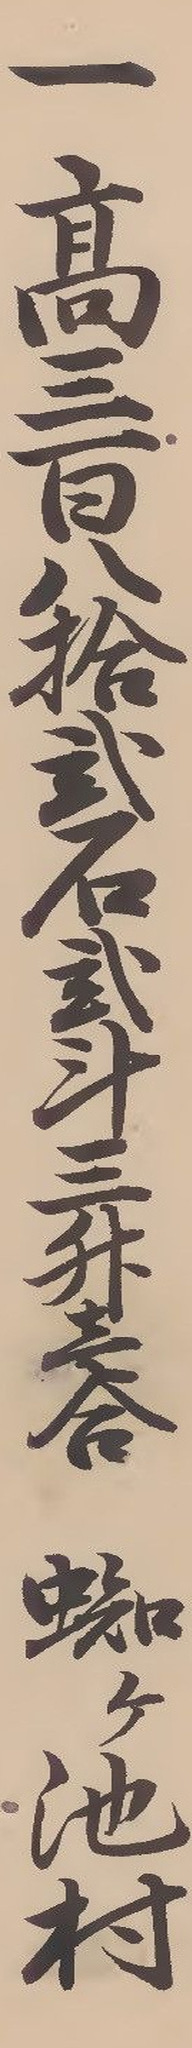一高三百八拾弐石弐斗三升壱合蜘ヶ池村
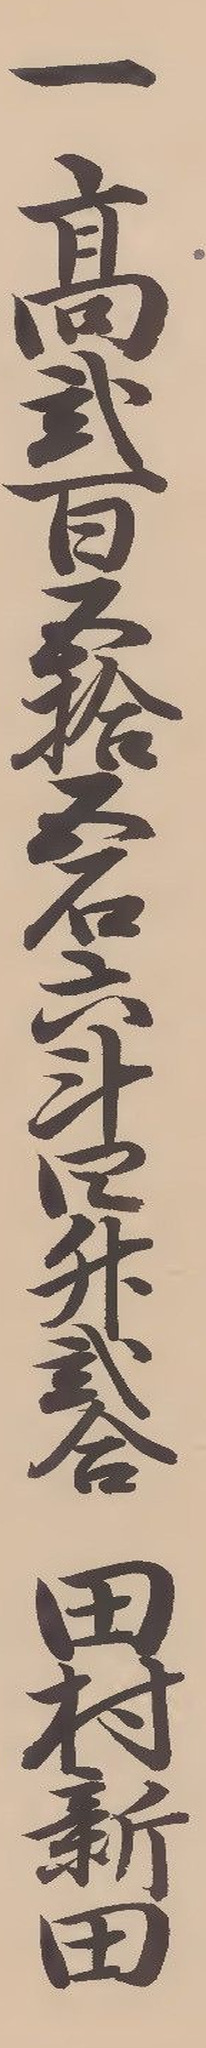一高弐百五拾五石六斗四升弐合田村新田
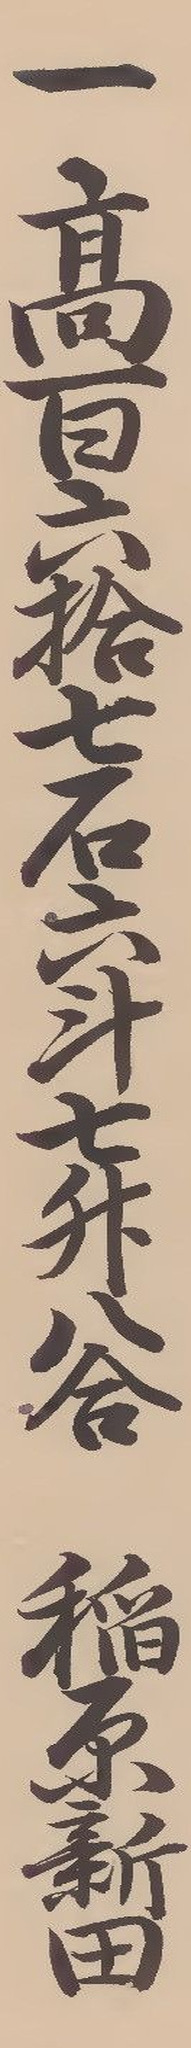一高百六拾七石六斗七升八合稲原新田

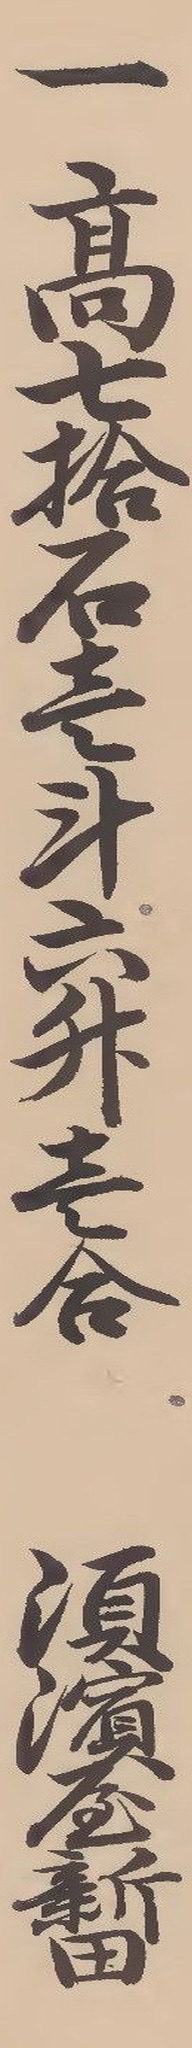一高七拾石壱斗六升壱合須浜屋新田
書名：越後国郷帳　上
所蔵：国立公文書館 National Archives of Japan
